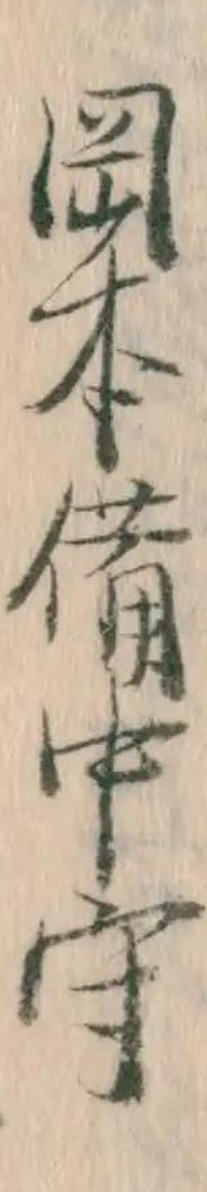岡本備中守
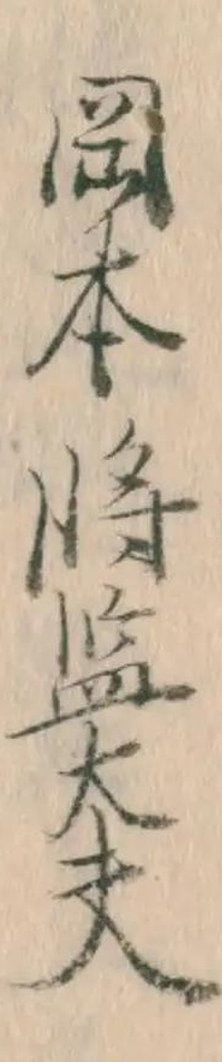岡本将監大夫
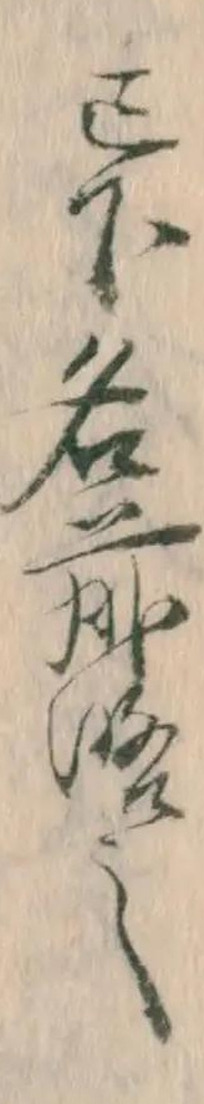已下名前略之
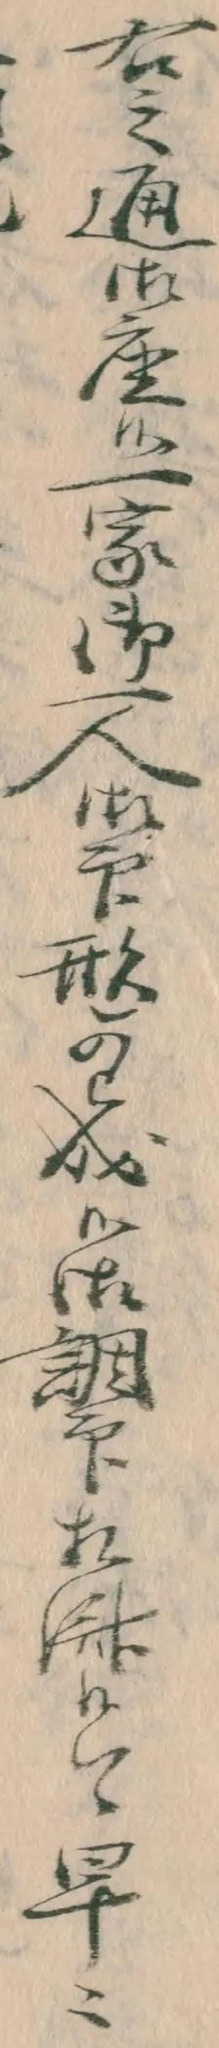右之通御座候一家御一人御印形可被成候御調印相済候ハヽ早々
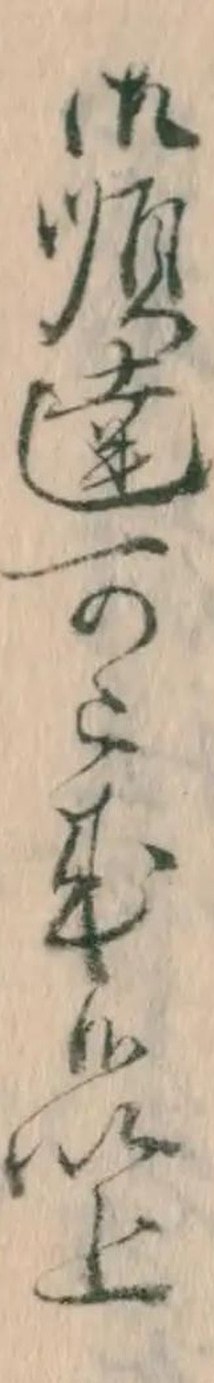御順達可被成候以上
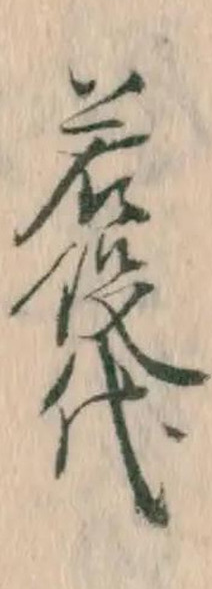若役代
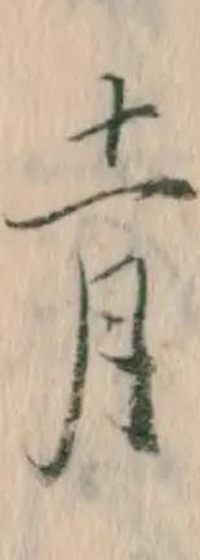十一月
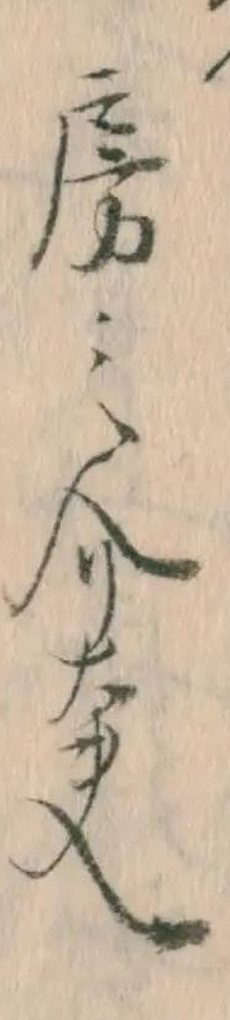房之介大夫
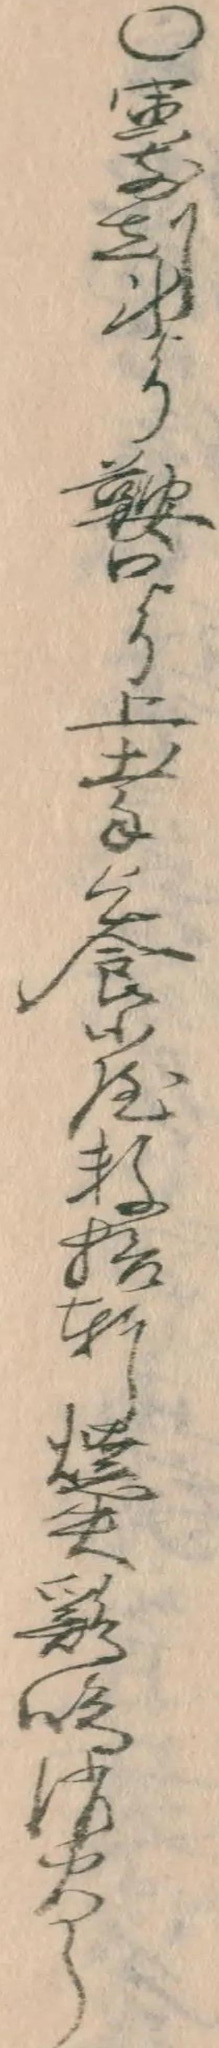〇寅前刻斗より鞍口より上土手乞食小屋数拾軒焼失鶏嶋消火了
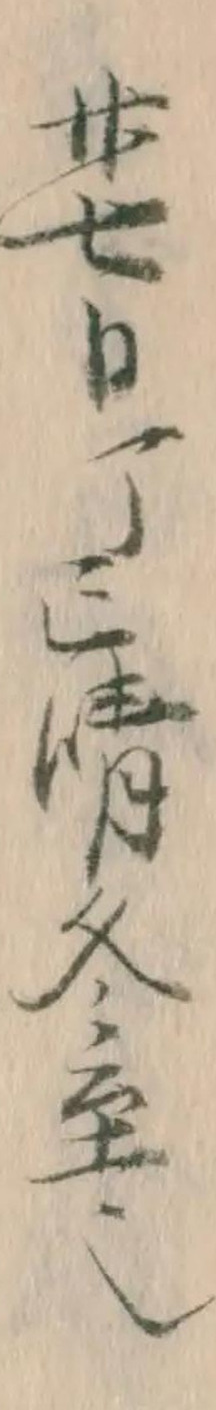廿七日丁巳晴冬至也
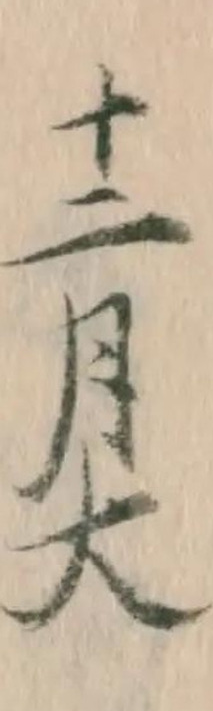十二月大
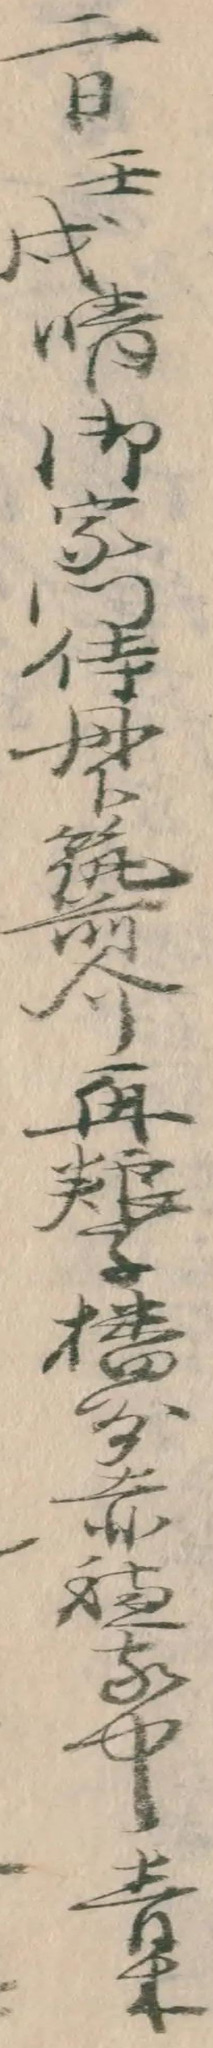二日壬戌晴御家門侍丹下筑前介再養子播州赤穂家中青木
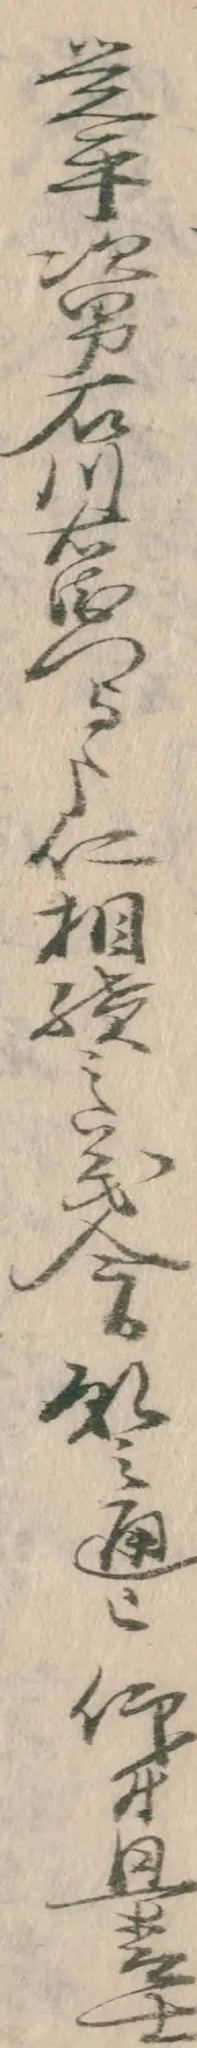覚平次男石川右衛門と申仁相談之義今日願之通被仰付且青士
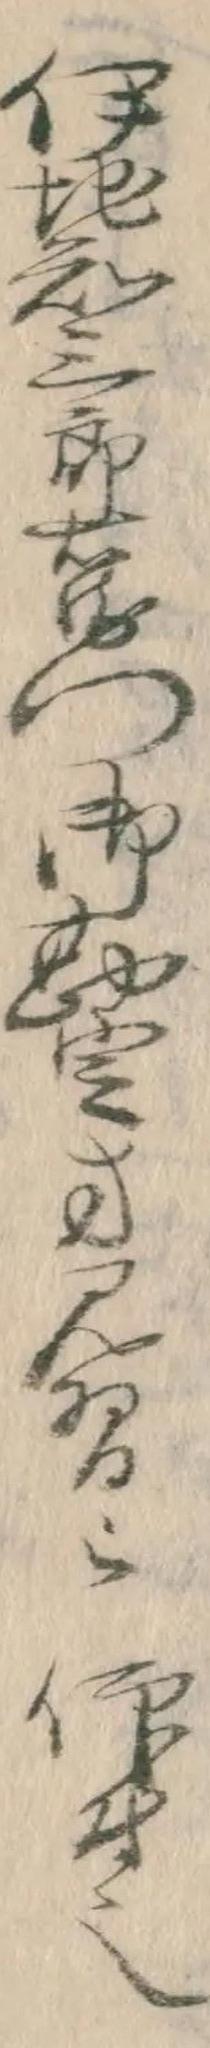伊地知三郎右衛門御勘定方見習被仰付也
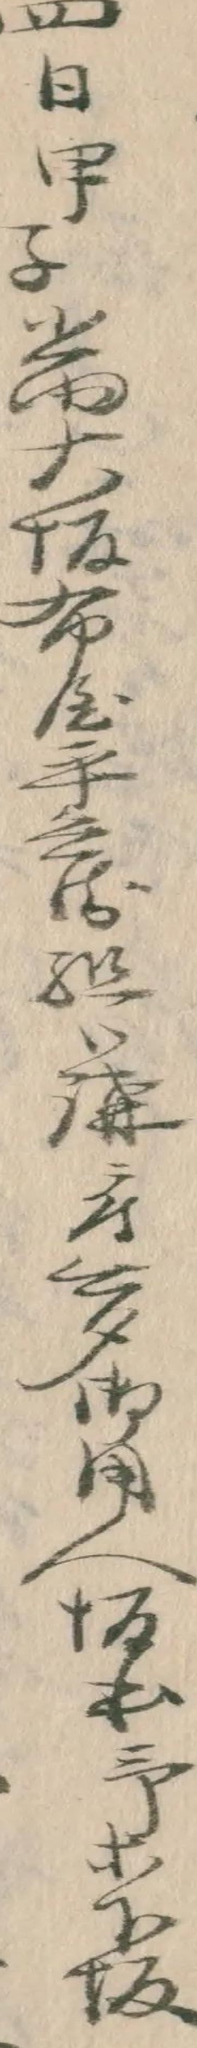四月甲子小雨大坂布屋平兵衛組御構ニ付今夕御用人坂本予等下坂
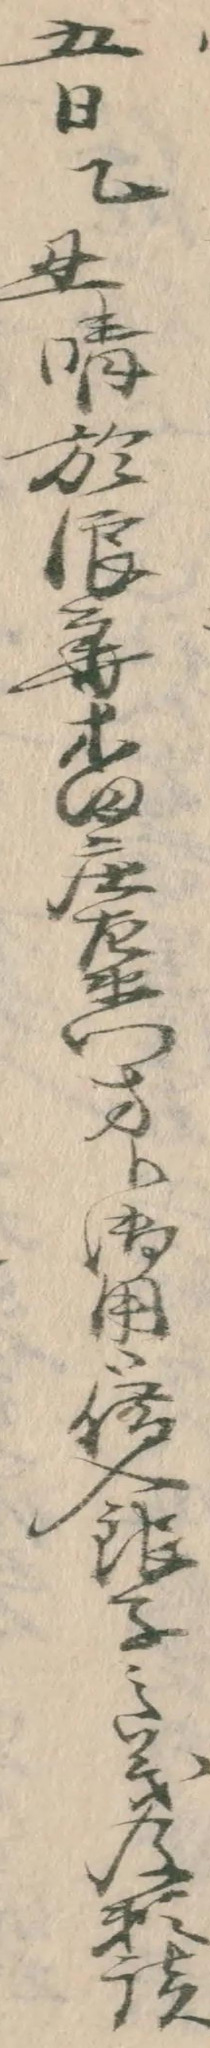五日乙丑晴於浪喜木田庄左衛門方え御用御借入銀子之義及頼請
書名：賀茂社記録. 第65冊
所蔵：国立国会図書館 National Diet Library, JAPAN
